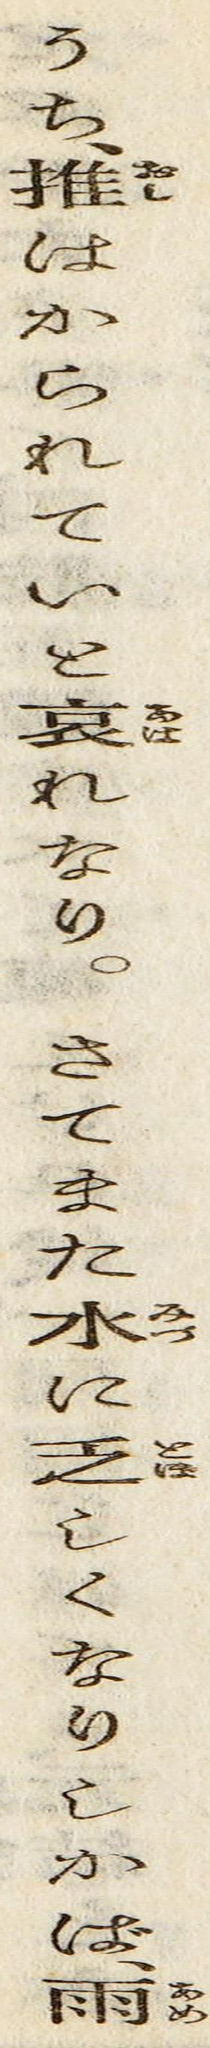うち、推はかられていと哀れなり。さてまた水に乏しくなりしかば、雨
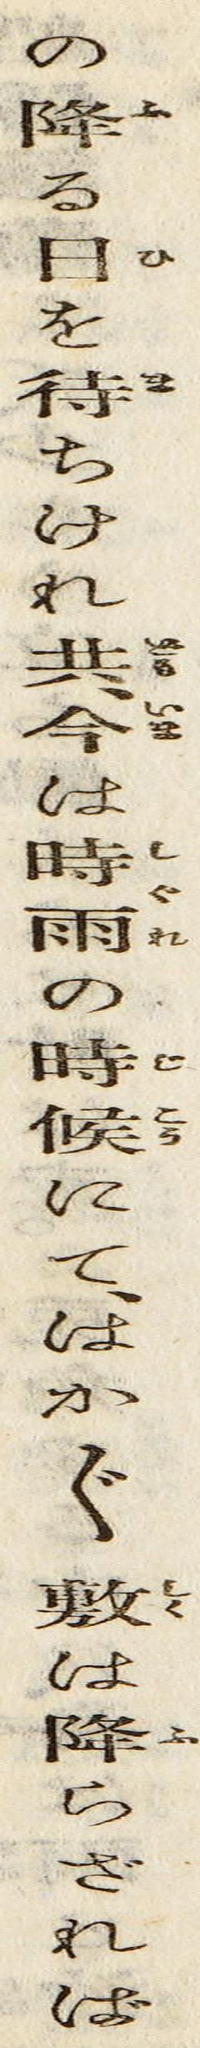の降る日を待ちけれ共、今は時雨の時候にて、はか〴〵敷は降らざれば
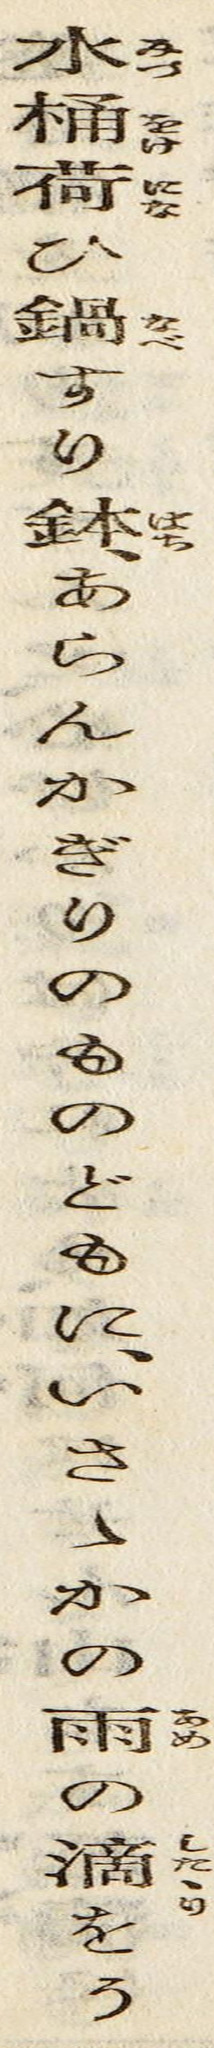水桶荷ひ鍋すり鉢、あらんかぎりのものどもに、いさゝかの雨の滴をう
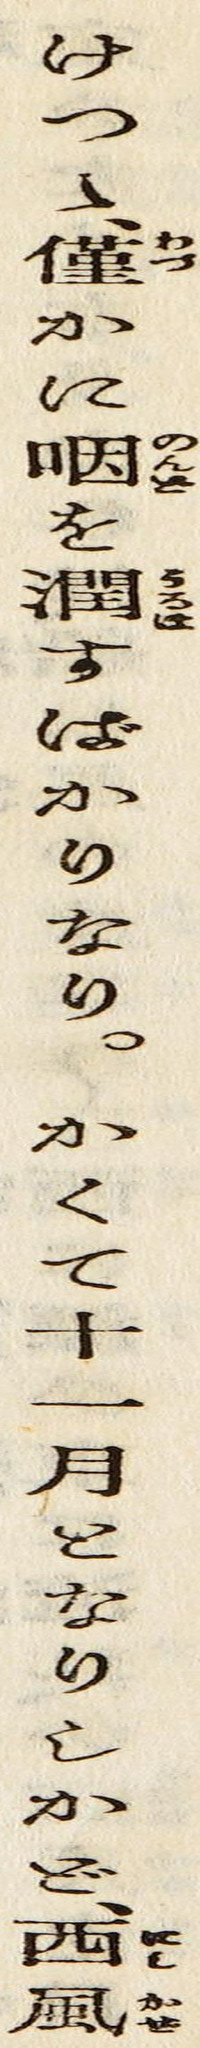けつゝ、僅かに咽を潤すばかりなり。かくて十一月となりしかど、西風
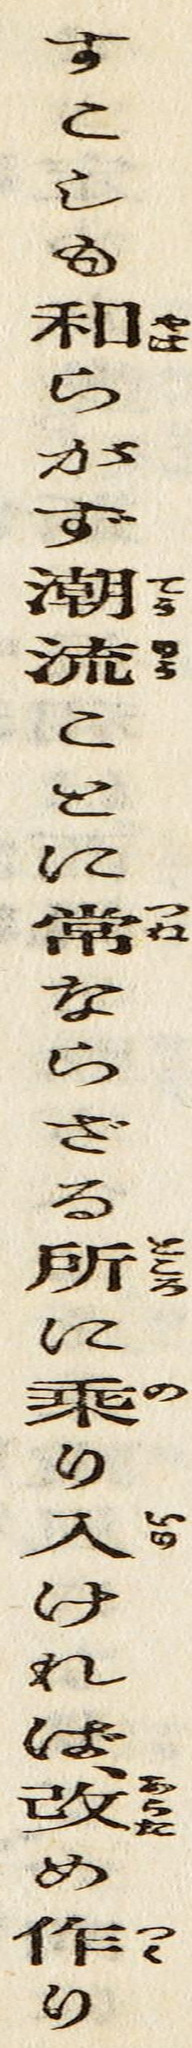すこしも和らがず潮流ことに常ならざる所に乗り入ければ、改め作り
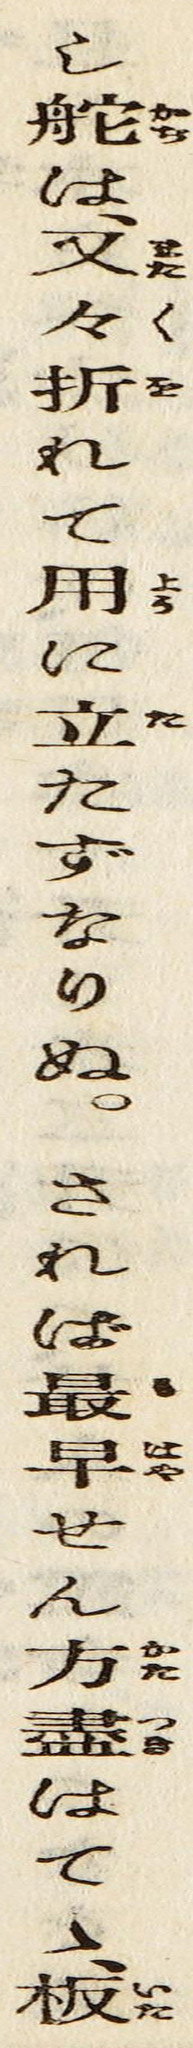し舵は、又々折れて用に立たずなりぬ。されば最早せん方尽はてゝ、板
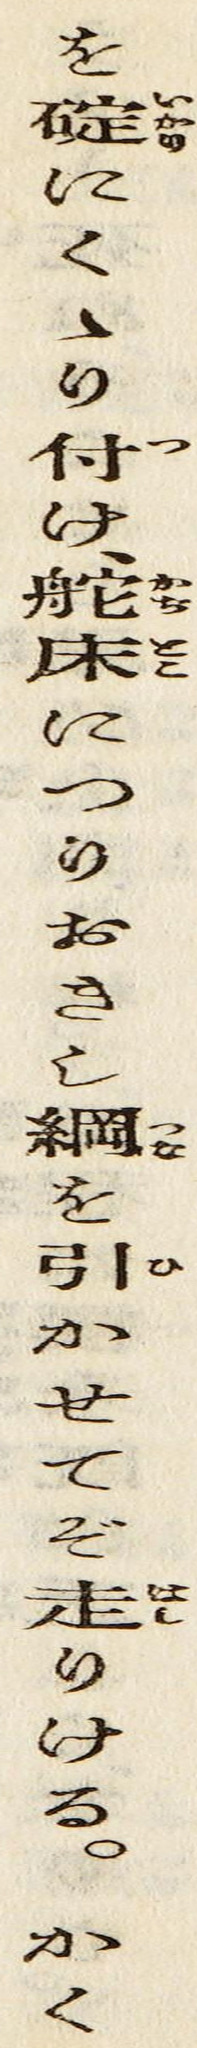を碇にくゝり付け、舵床につりおきし綱を引かせてぞ走りける。かく
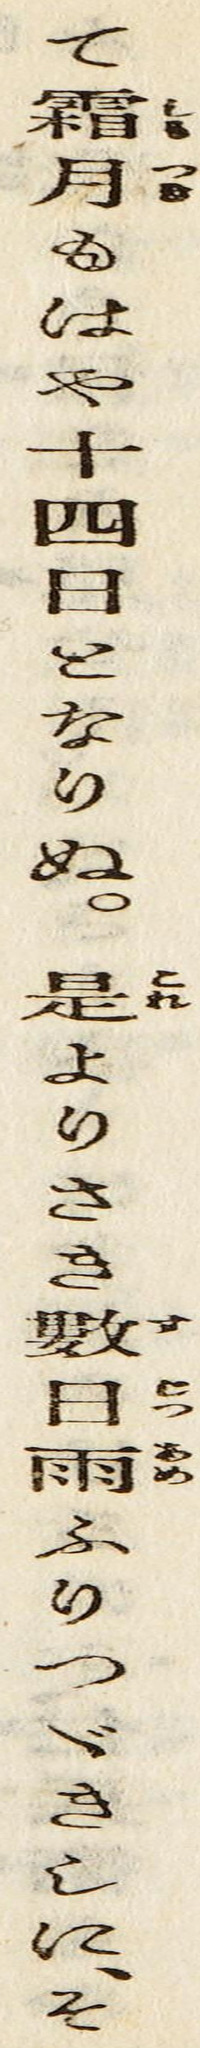て霜月もはや十四日となりぬ。是よりさき数日雨ふりつヾきしに、そ
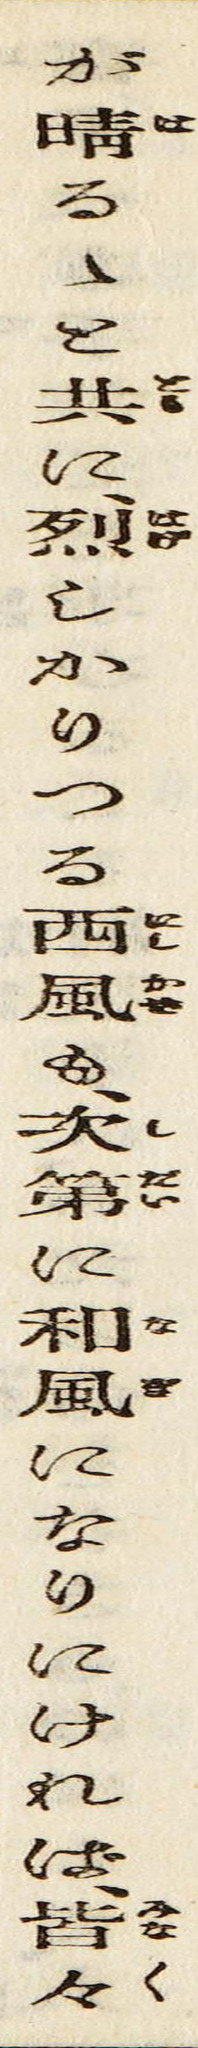が晴るゝと共に、烈しかりつる西風も、次第に和風になりにければ、皆々
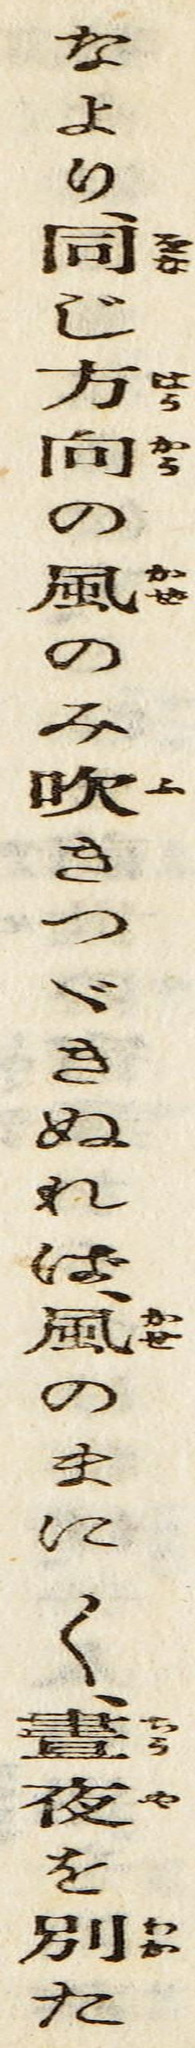なより、同じ方向の風のみ吹きつヾきぬれば、風のまに〳〵、昼夜を別た
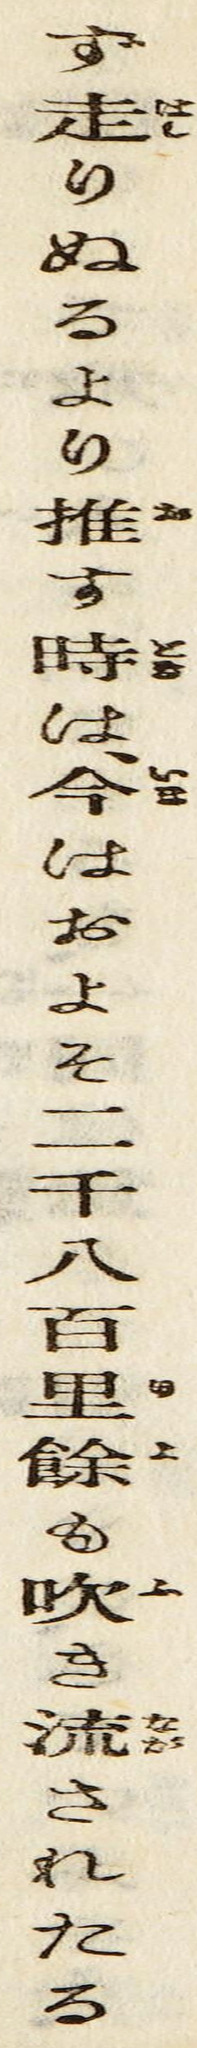ず走りぬるより推す時は、今はおよそ二千八百里余も吹き流されたる
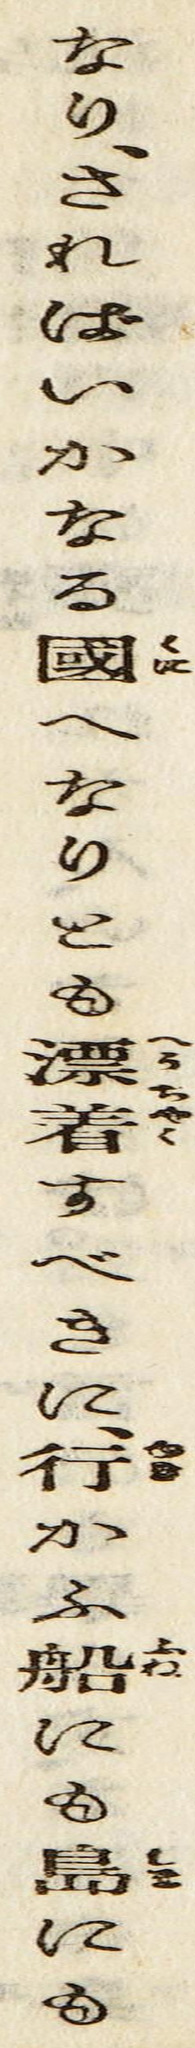なり、さればいかなる国へなりとも漂着すべきに、行かふ船にも島にも
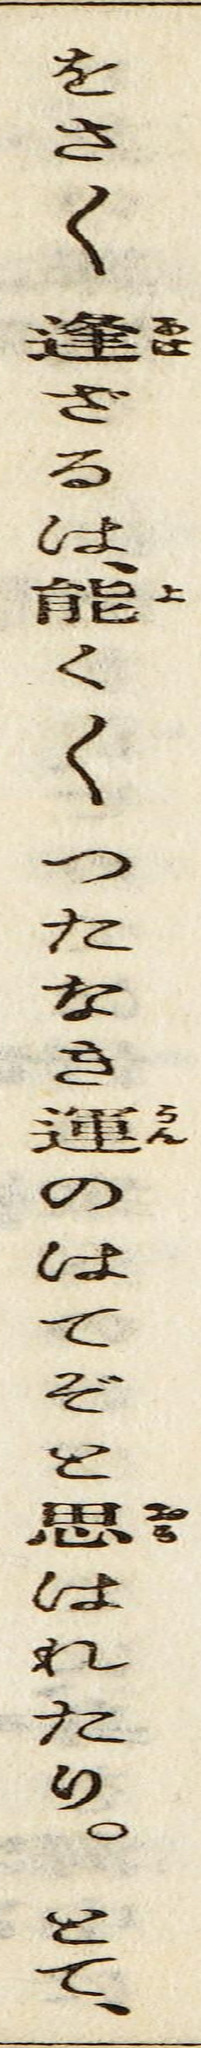をさ〳〵逢ざるは、能く〳〵つたなき運のはてぞと思はれたり。とて、

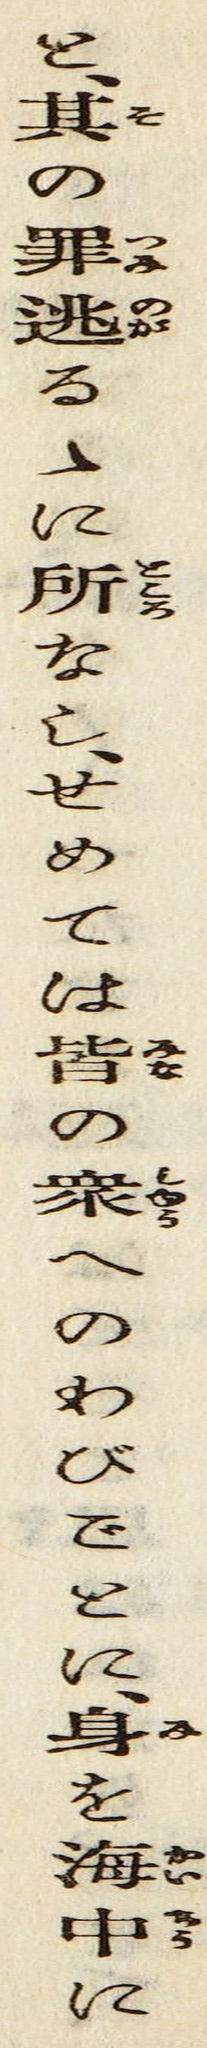と、其の罪逃るゝに所なし、せめては皆の衆へのわびごとに、身を海中に
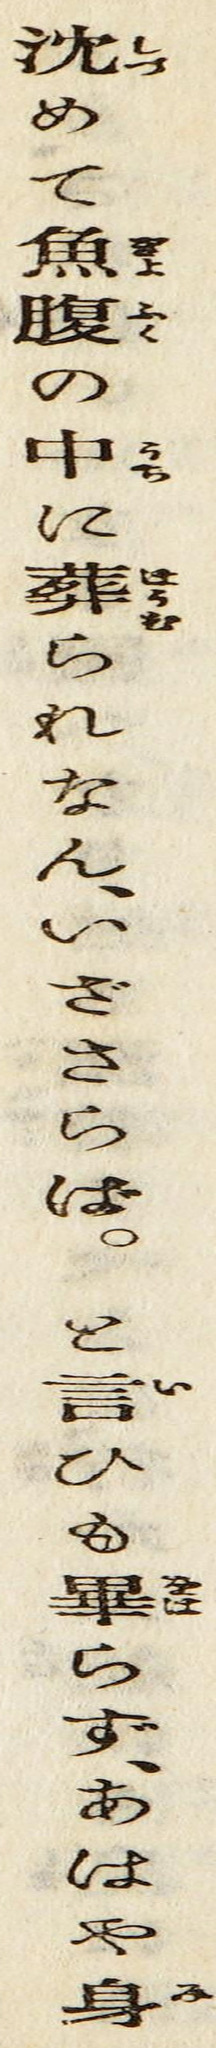沈めて魚腹の中に葬られなん、いざさらば。と言ひも畢らず、あはや身
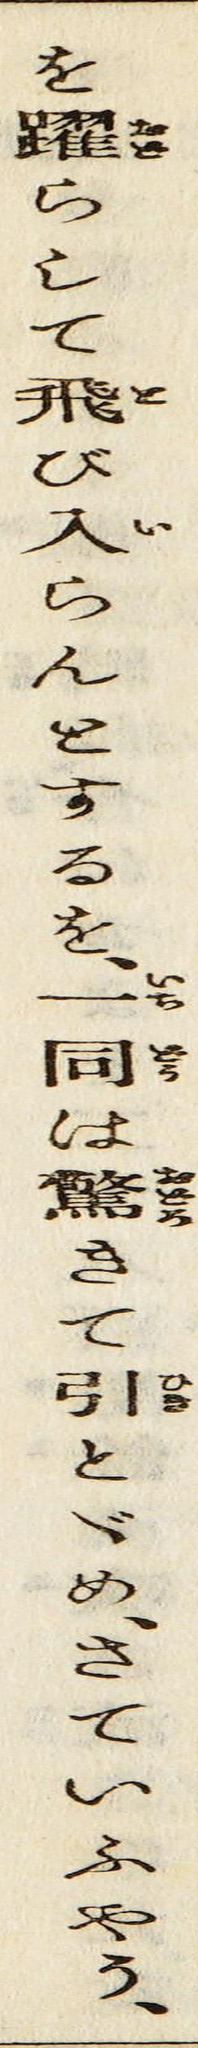を躍らして飛び入らんとするを、一同は驚きて引とヾめ、さていふやう、
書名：日本漂流譚
